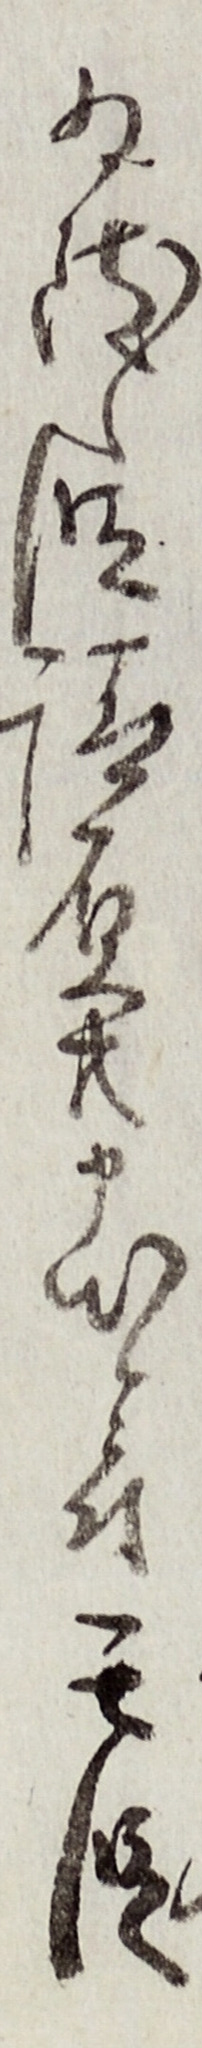為致候段請負共申出候ニ付其段
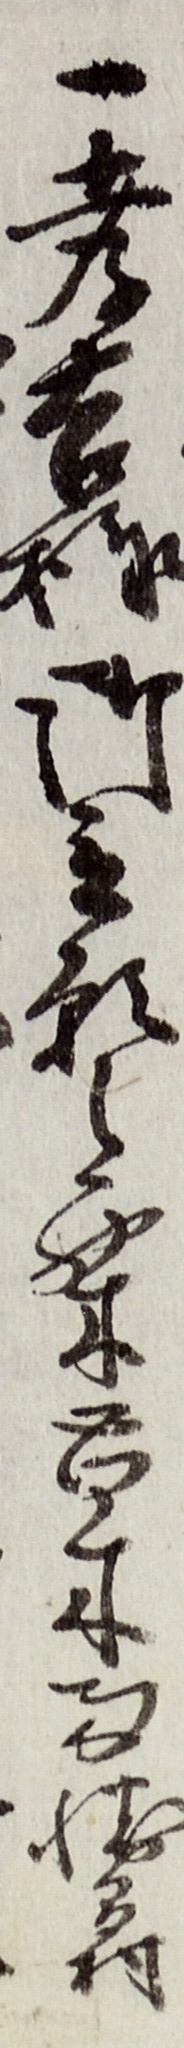一孝吉様御立願之栗苗木両勝間村
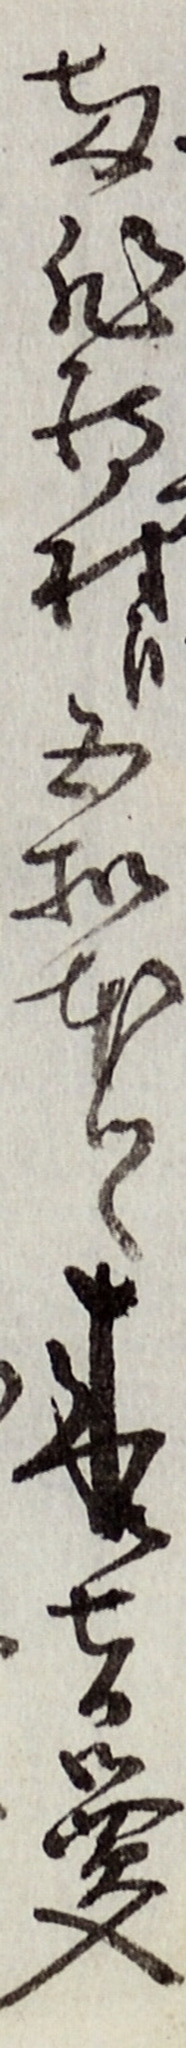両非持村江五拾本ツヽ来ル七日御買入
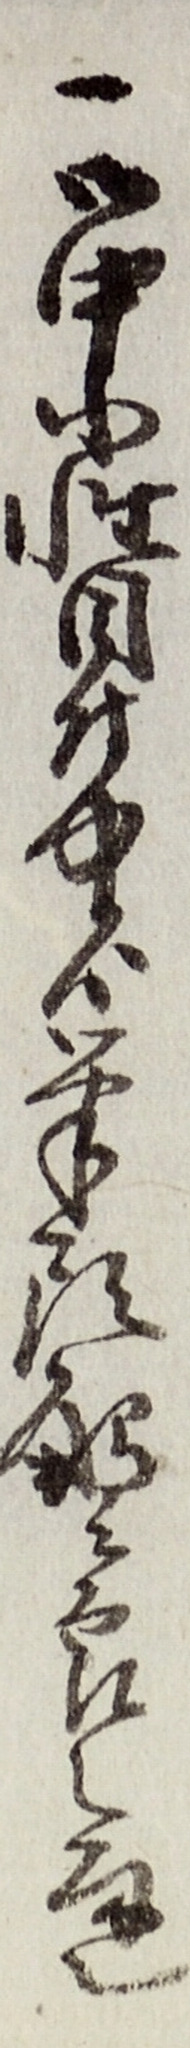一御中小性目付中ゟ筆頭触ニ而左之通
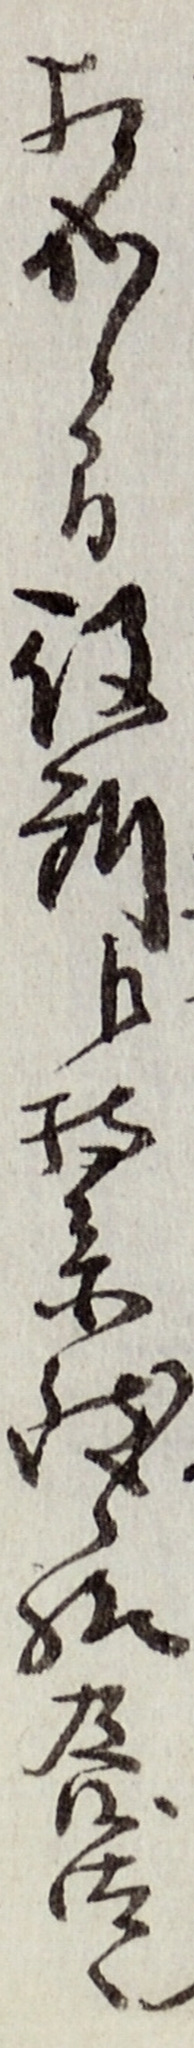相成候間役所江持参致候様及沙汰候
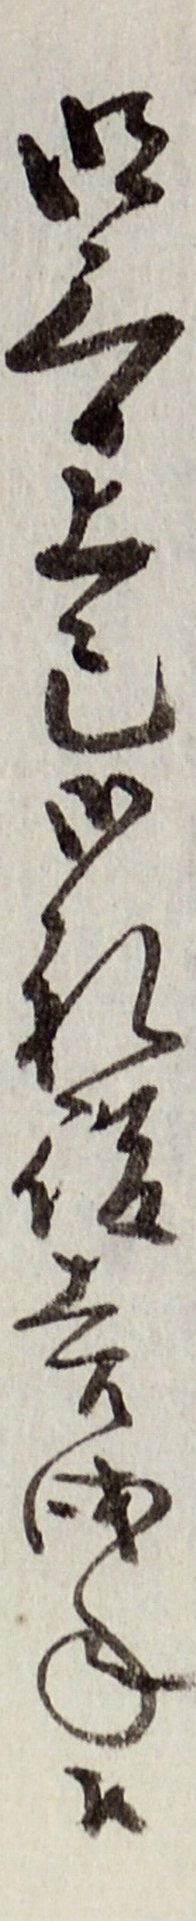明三日上巳御礼役去ル戌年被
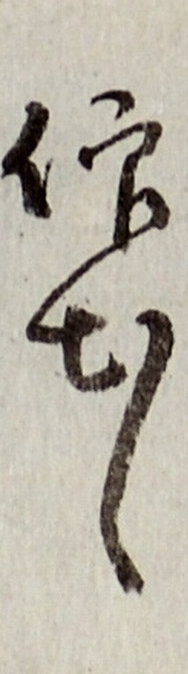仰出候
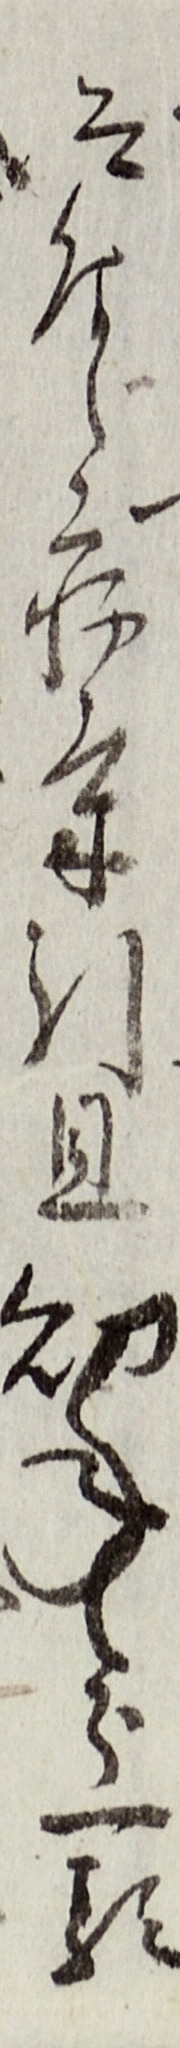仰付候病気引且初年之分一類
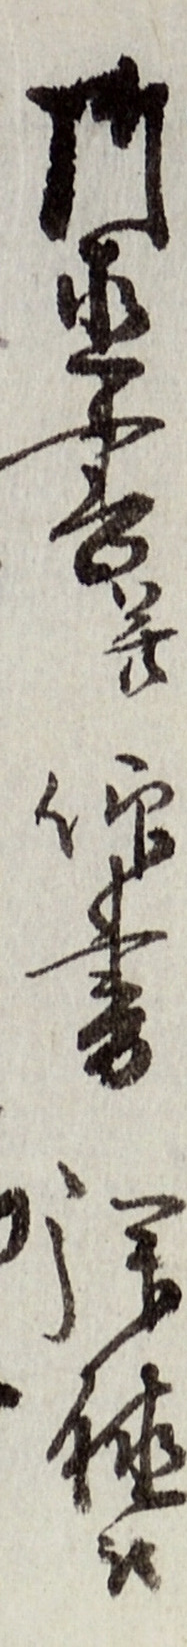御直書并仰書拝聴被
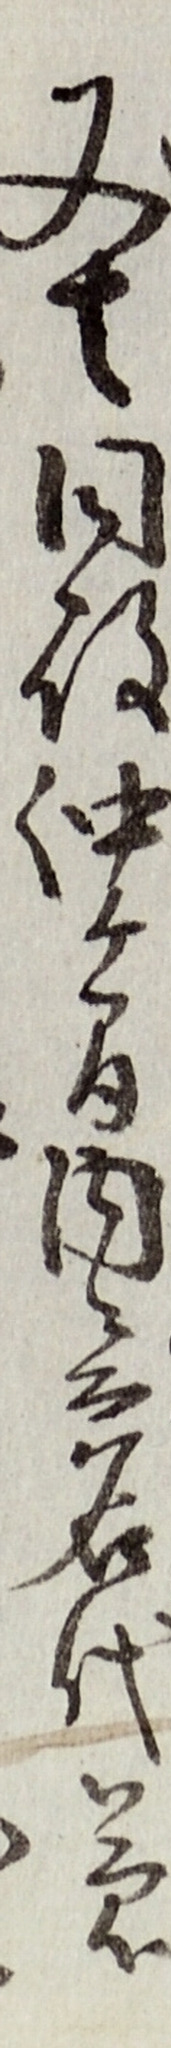又者同役仲ケ間内ニ而名代ニ而被
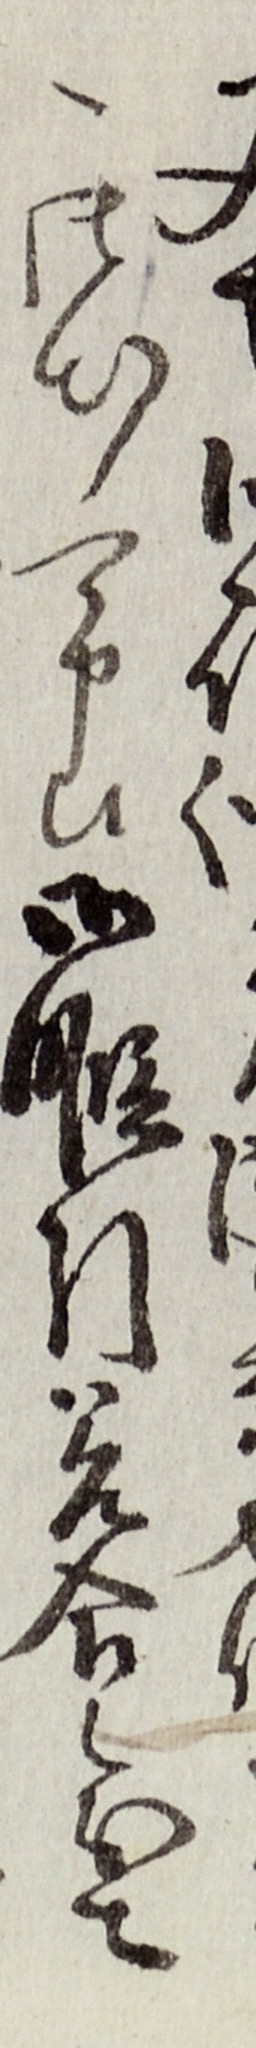罷出可申候御暇引差合之分者
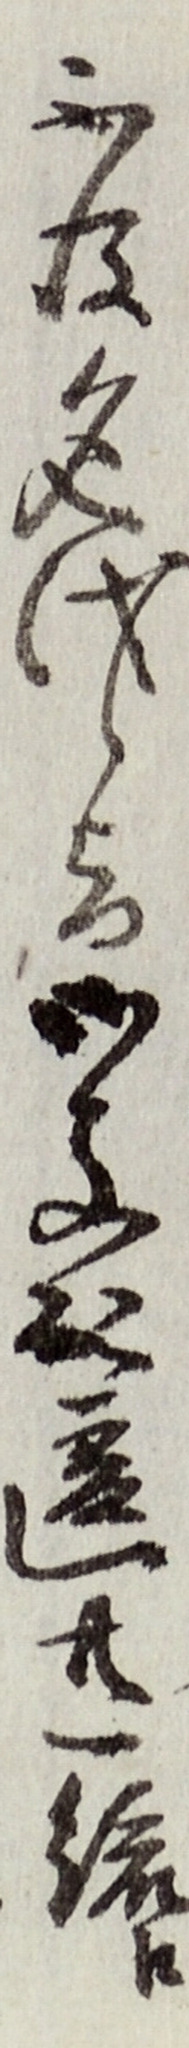不及名代候旨御支配違共一統江
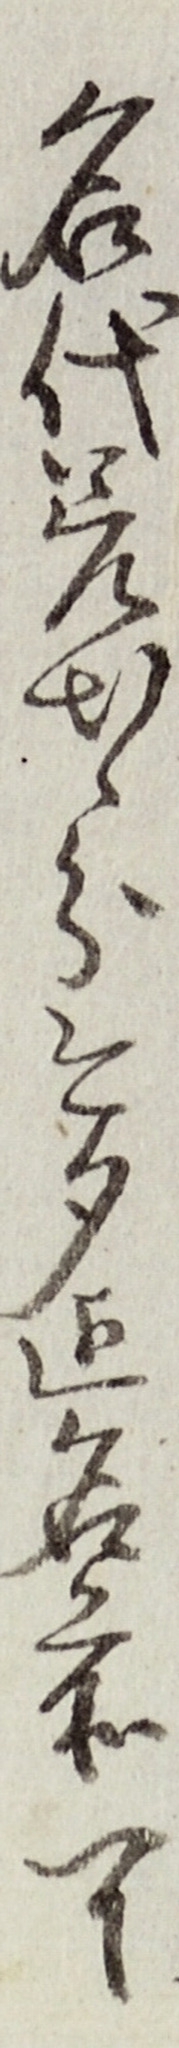名代差出候分今夕迄名前可
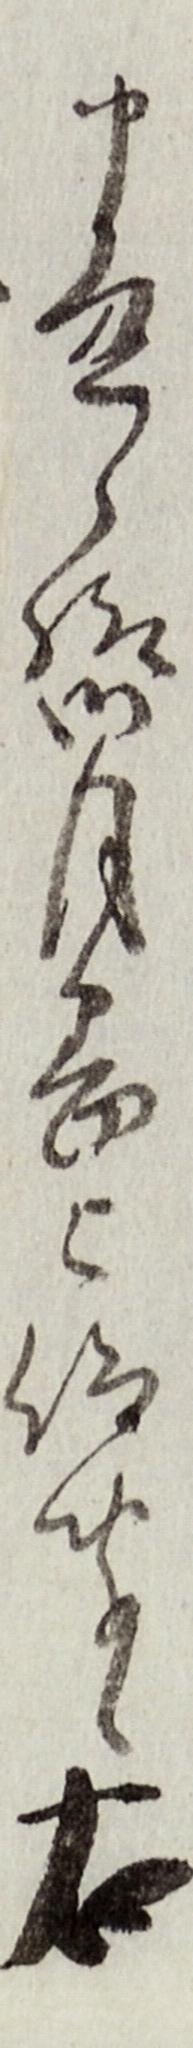申通候様御月番被仰聞候右
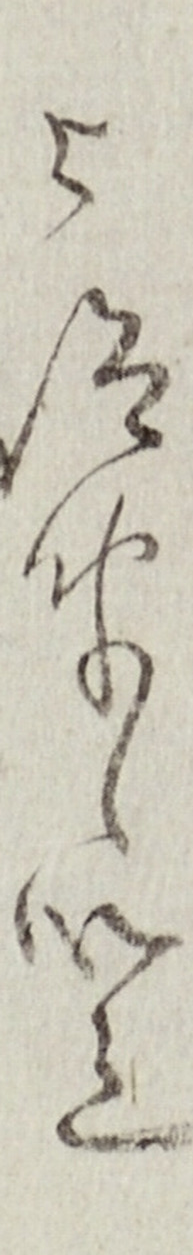被仰聞候以上
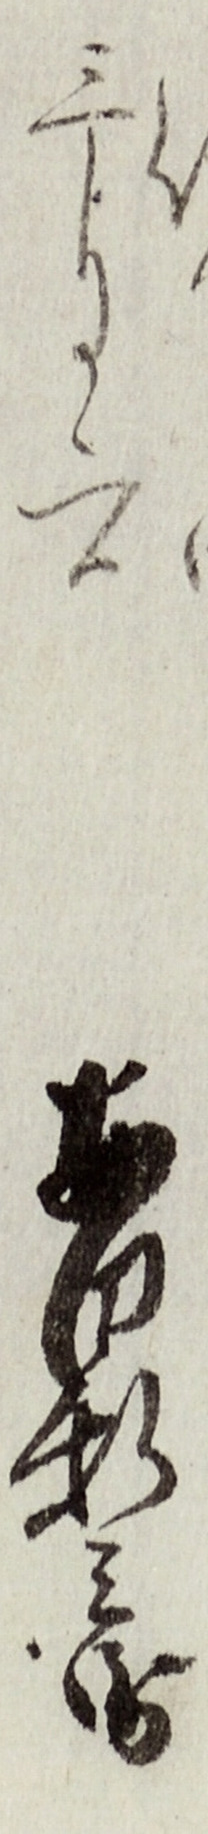三月二日安田新兵衛
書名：御山方御薪方諸事御用留
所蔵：伊那市立高遠町図書館・合同会社AMANE
